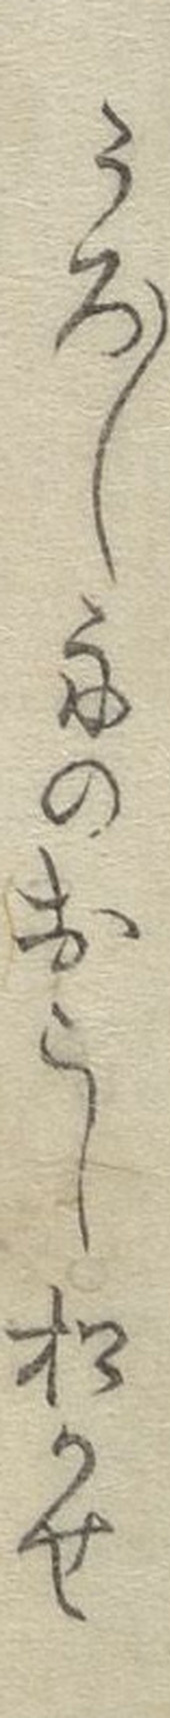うろ〳〵舟のおこし松かせ
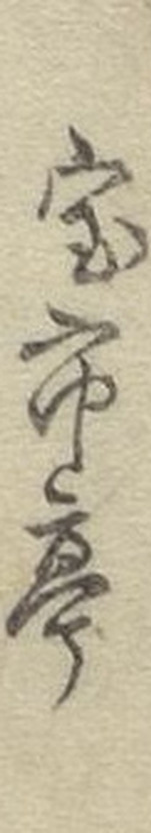宝市亭
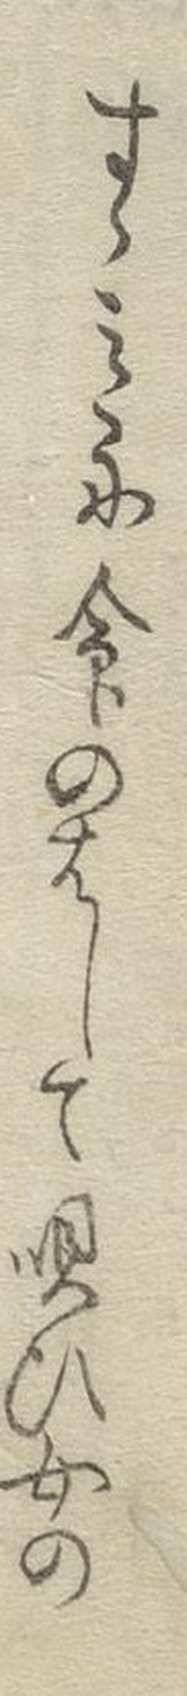すゝみ舟命のはして唄ひ女の
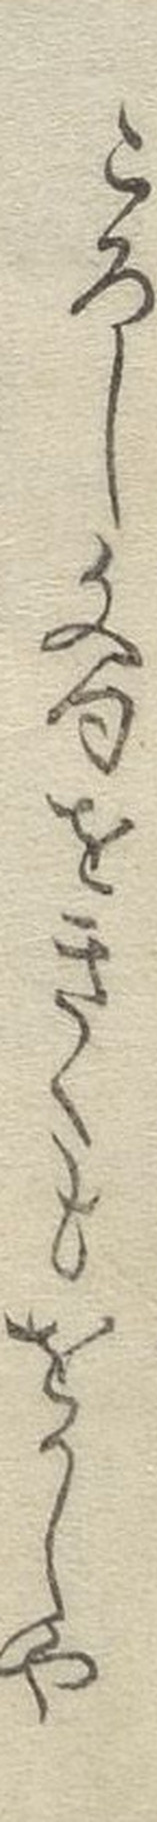ころし文句をきくもをかしや
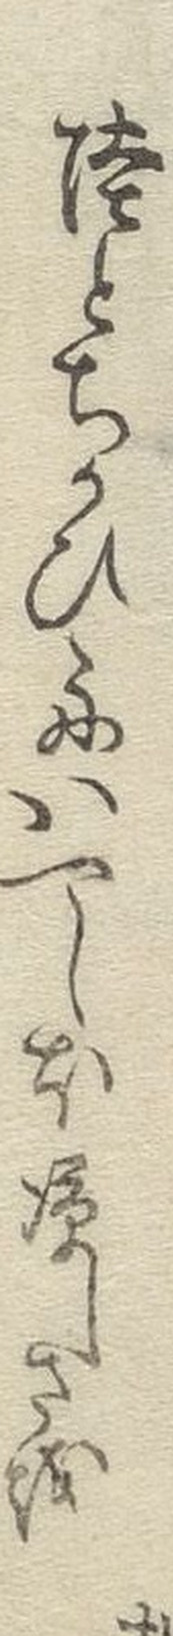陸とちかひ舟は一しほ涼しきを
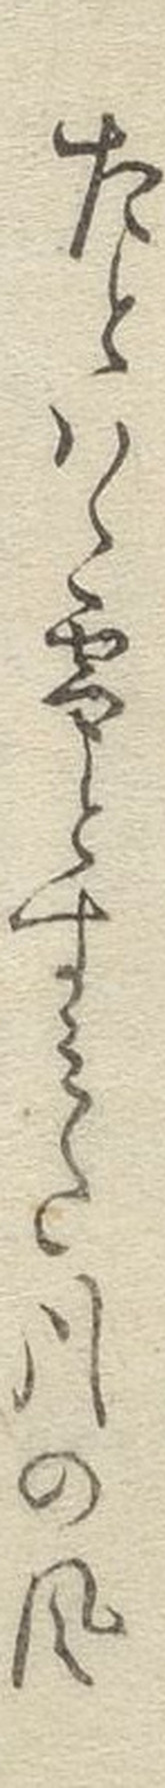たとはゝ雪とすみた川の風
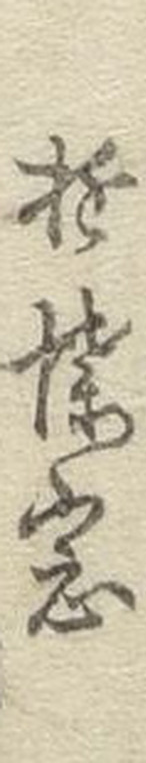遊蝶窓
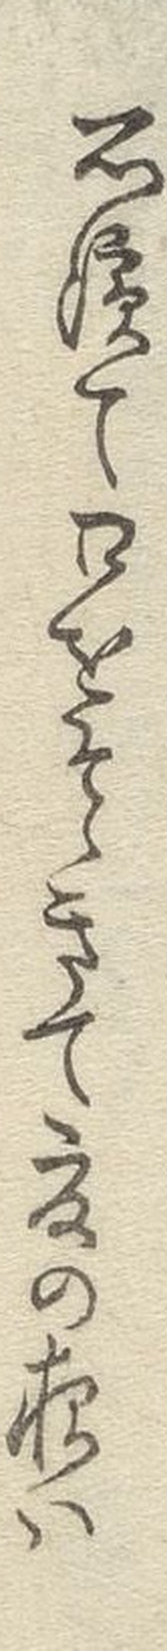石濱て口をそゝきて夏の夜は
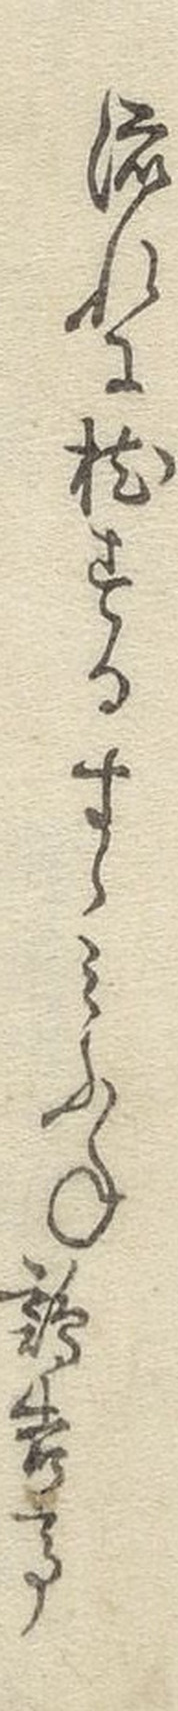流れに枕するすゝみふね鶏告亭
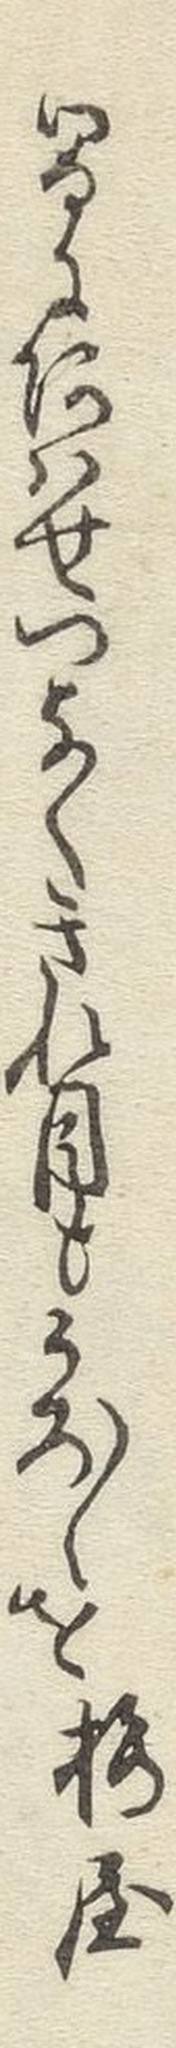間にあはせつなくきれ目もうろ〳〵を梅屋
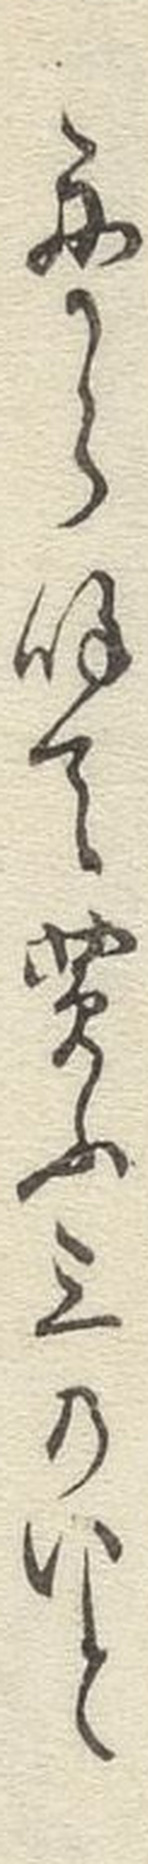舟から呼てかふ三のいと
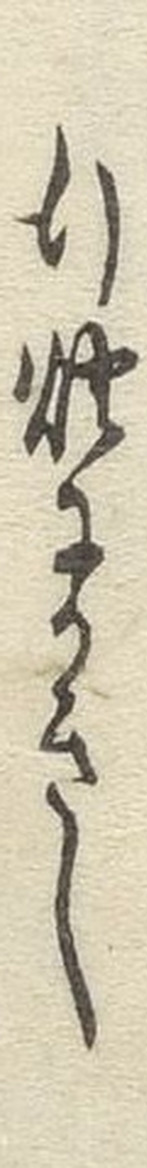行燈にかきし
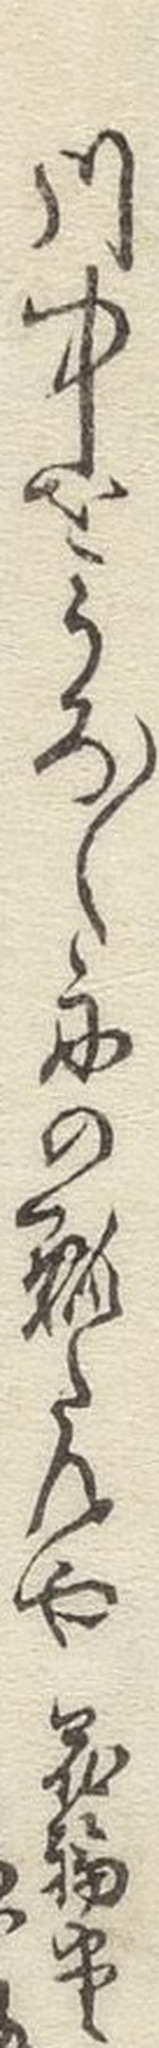川中をうろ〳〵舟の瓢たんや花輪堂
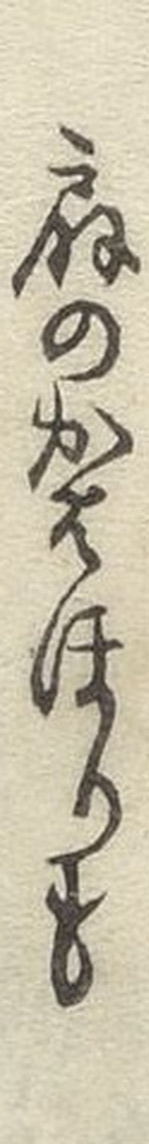扇のかはほりも
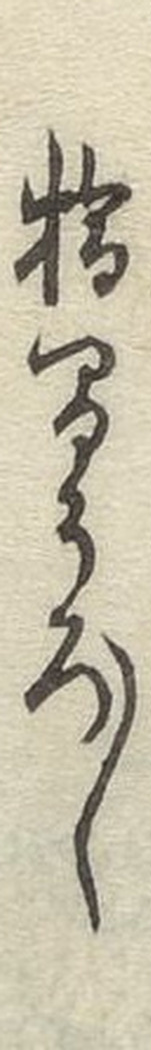橋間うろ〳〵
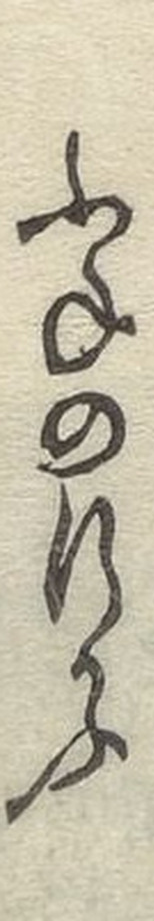ふねの行かふ
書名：Picture Album of People with Kyōka (Light Verse) (Kyōka shiki jinbutsu 狂歌四季人物)
